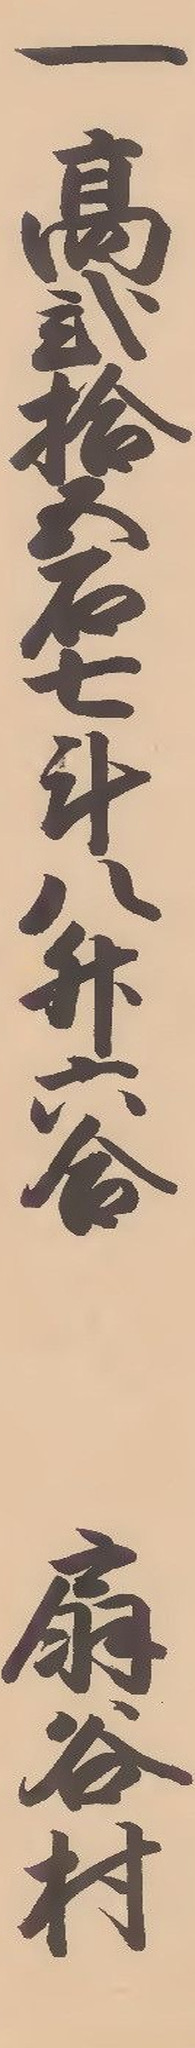一髙弐拾五石七斗八升六合扇谷村

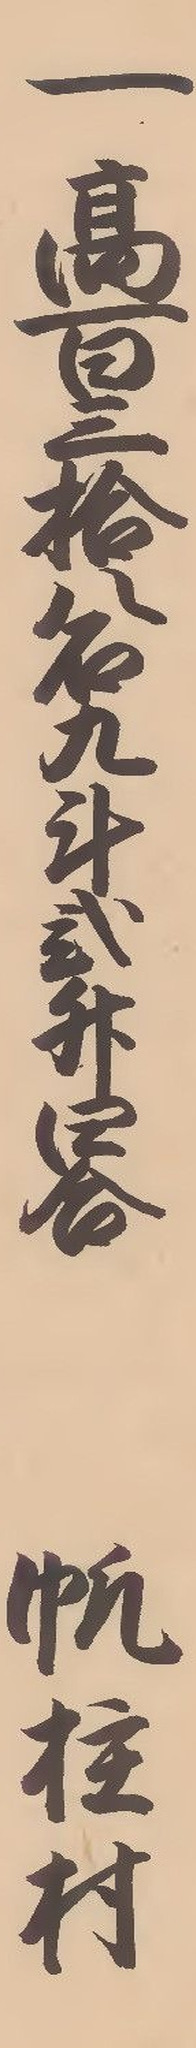一髙百三拾八石九斗弐升四合帆柱村
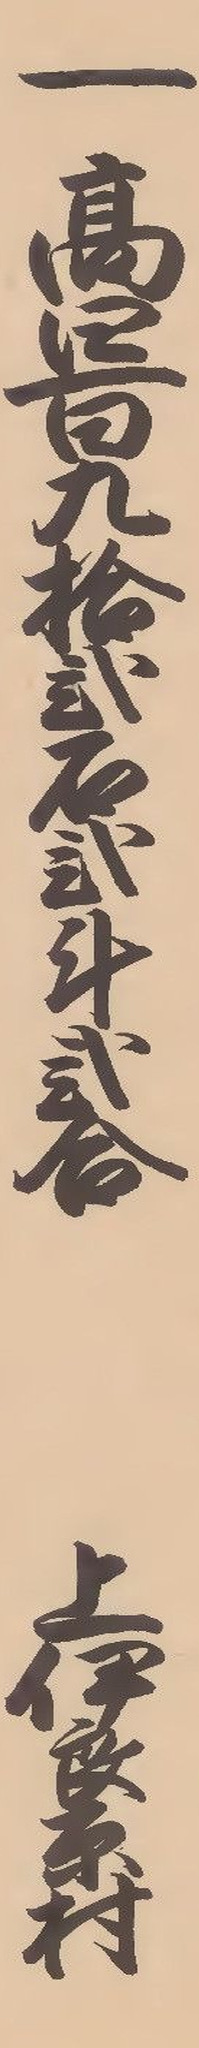一髙四百九拾弐石弐斗弐合上伊良原村
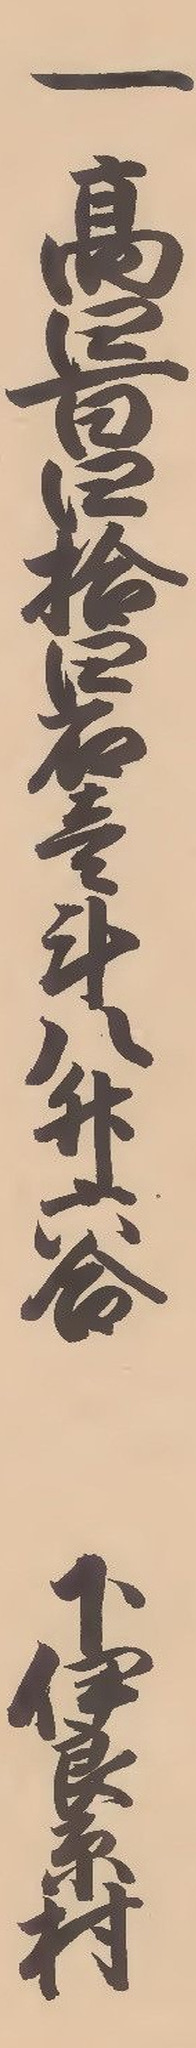一髙四百四拾四石壱斗八升六合下伊良原村
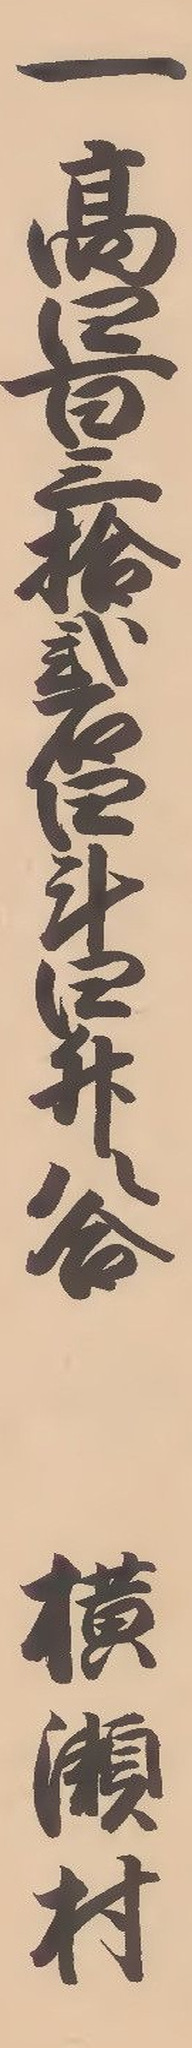一高四百三拾弐石四斗四升八合横瀬村
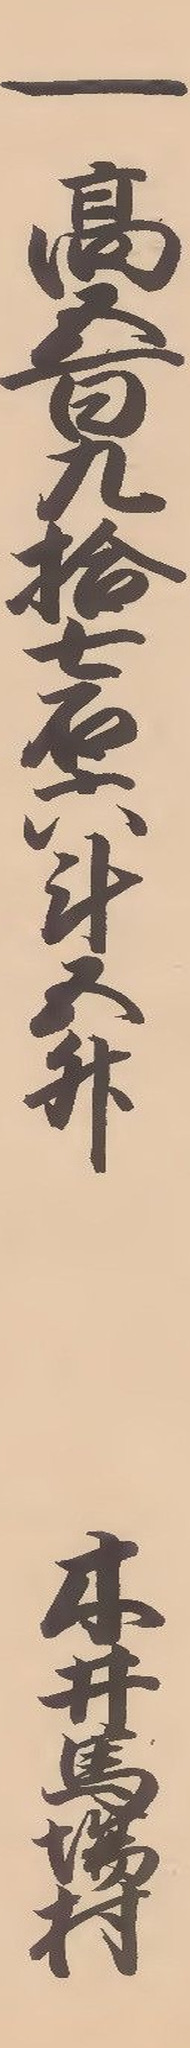一髙五百九拾七石六斗五升木井馬場村
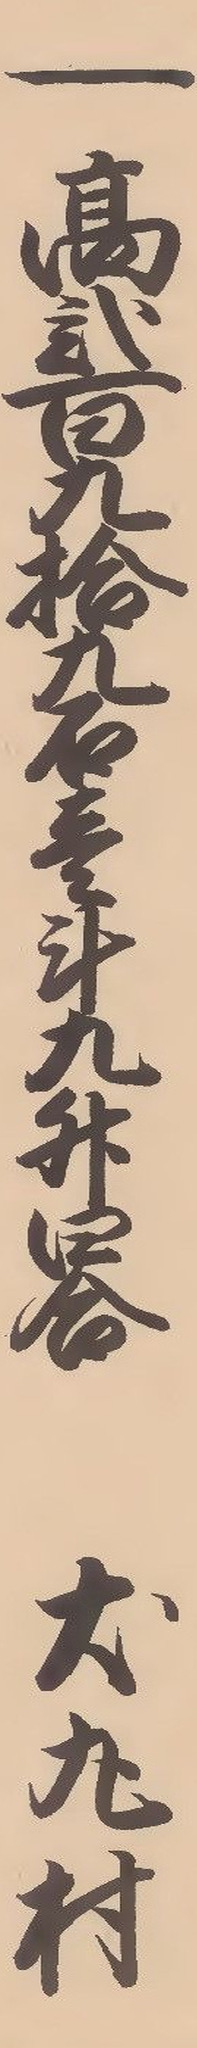一髙弐百九拾九石壱斗九升四合犬丸村
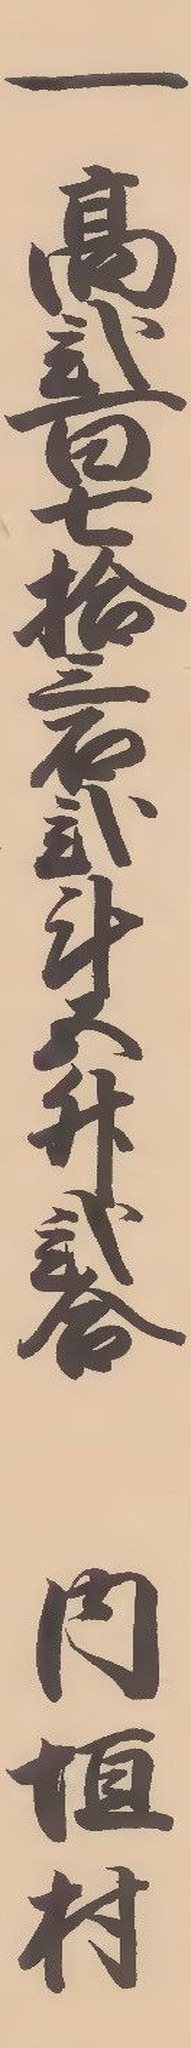一髙弐百七拾三石弐斗五升弐合内垣村
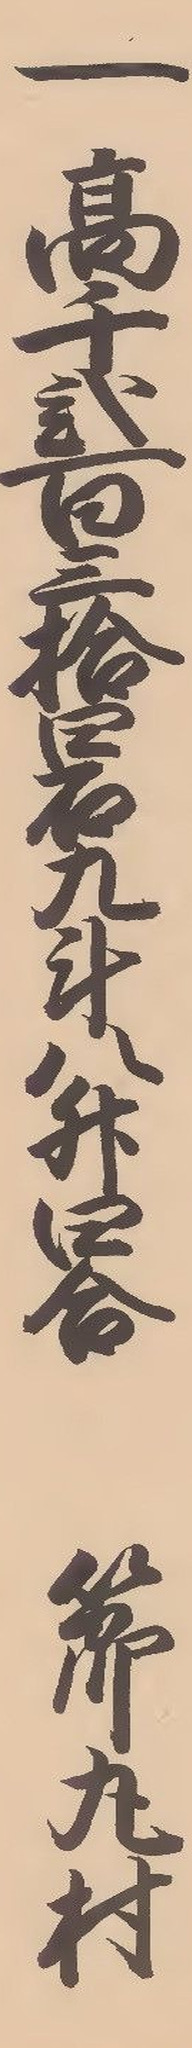一髙千弐百三拾四石九斗八升四合節丸村

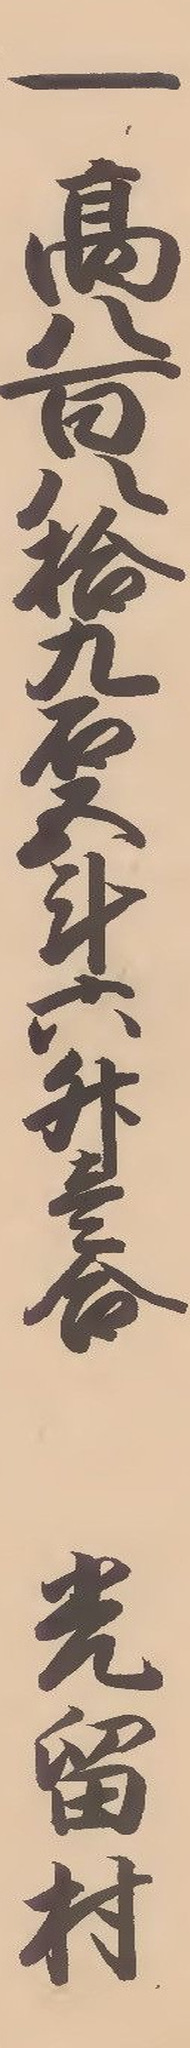一髙八百八拾九石五斗六升壱合光留村
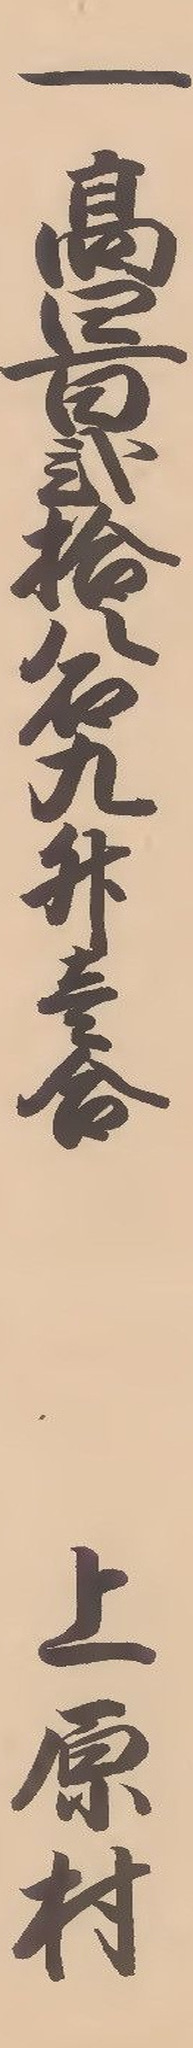一髙四百弐拾八石九升壱合上原村
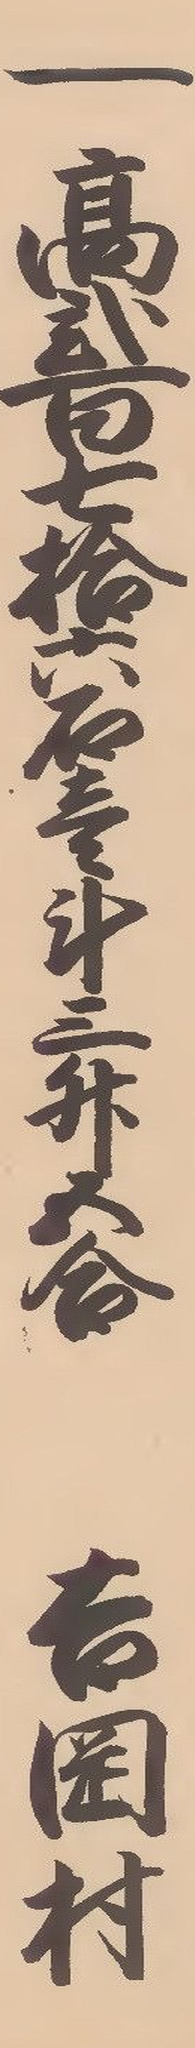一髙弐百七拾六石壱斗三升五合吉岡村
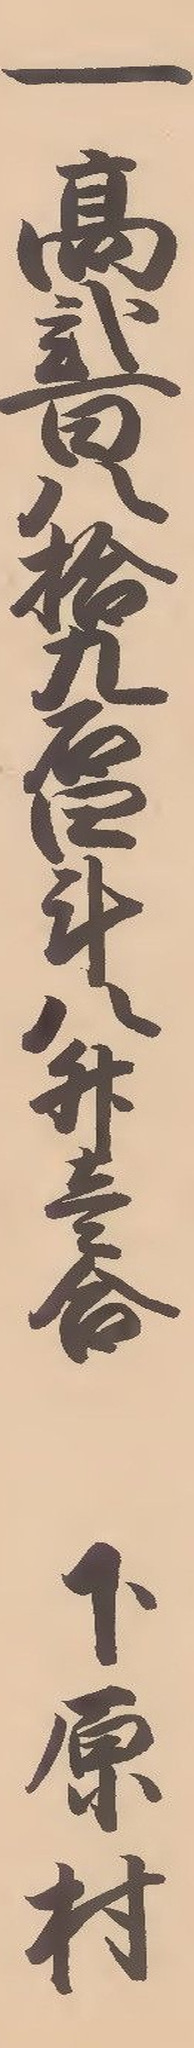一髙弐百八拾九石四斗八升壱合下原村
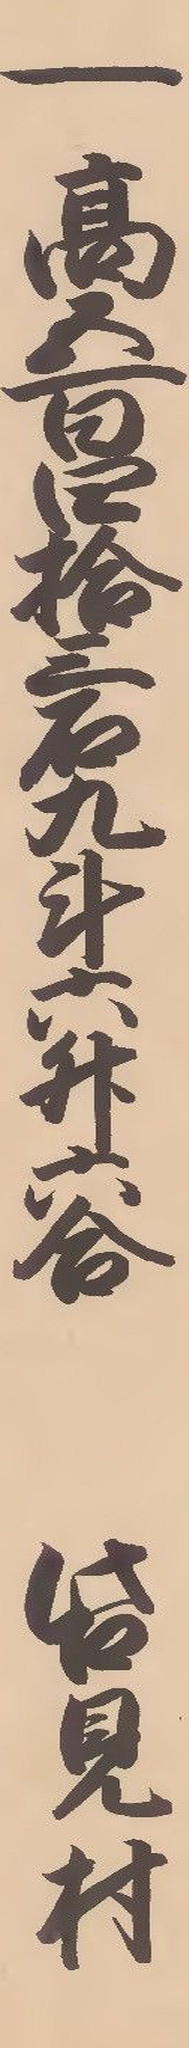一髙五百四拾三石九斗六升六合見村
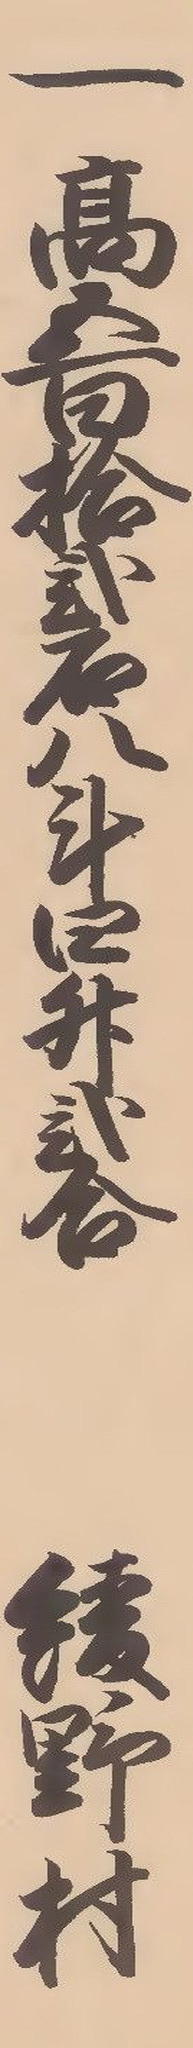一髙五百拾弐石八斗四升弐合綾野村
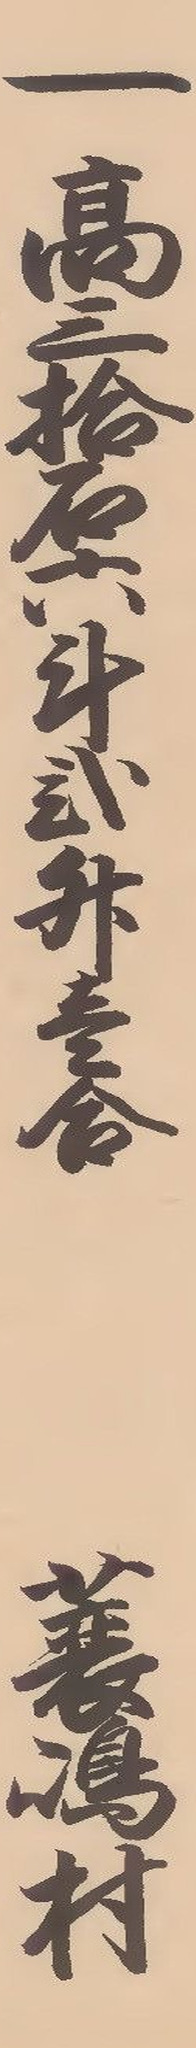一髙三拾石六斗弐升壱合嶋村
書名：豊前国郷帳
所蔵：国立公文書館 National Archives of Japan
